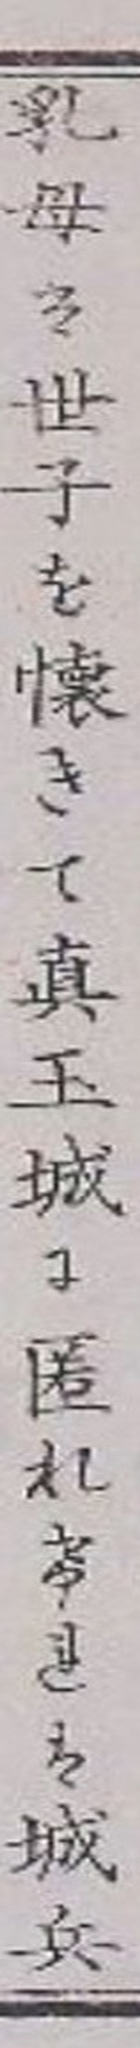乳母は世子を懐きて真玉城に匿れけれは城兵
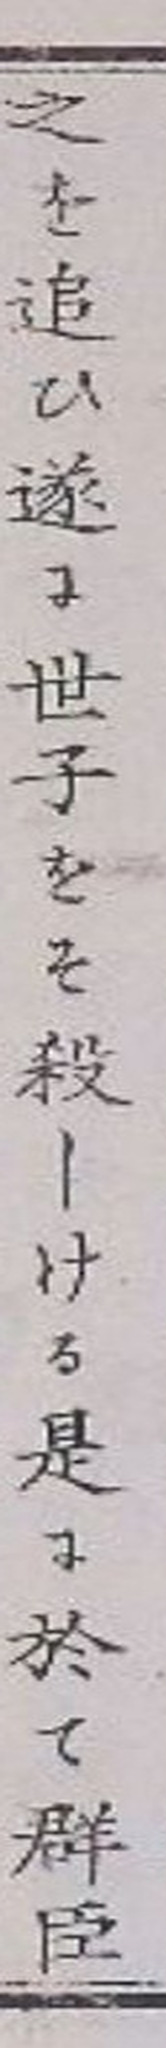之を追ひ遂に世子をそ殺しける是に於て群臣
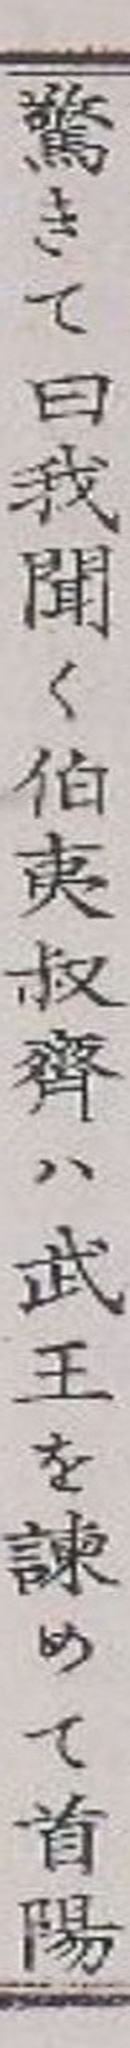驚きて曰我聞く伯夷叔斉は武王を諫めて首陽
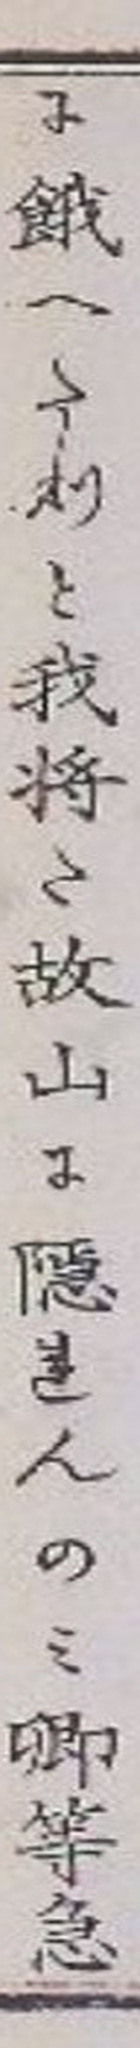に餓へたりと我将た故山に隠れんのみ卿等急
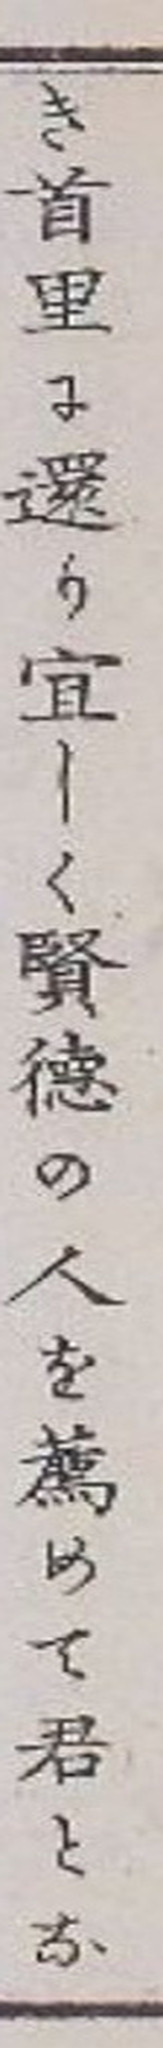き首里に還り宜しく賢徳の人を薦めて君とな
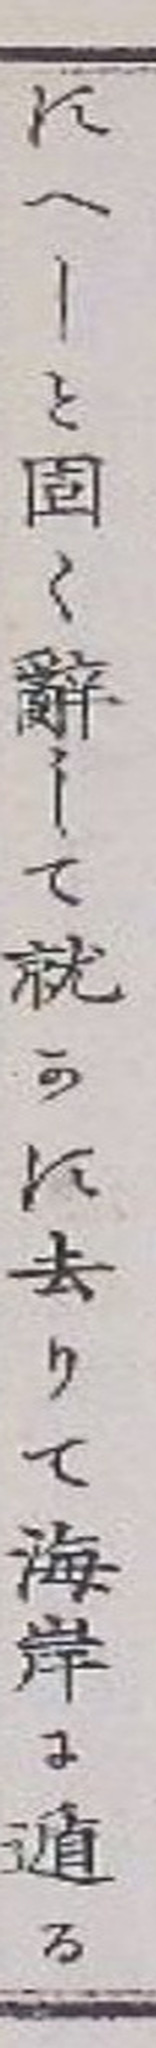すへしと固く辞して就かす去りて海岸に遁る
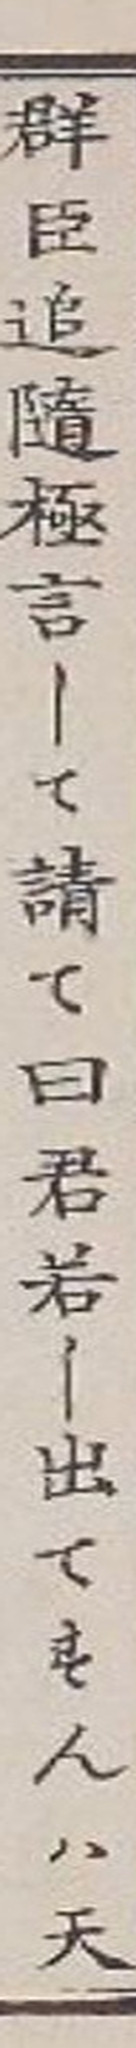群臣追隨極言して請て曰君若し出てすんは天
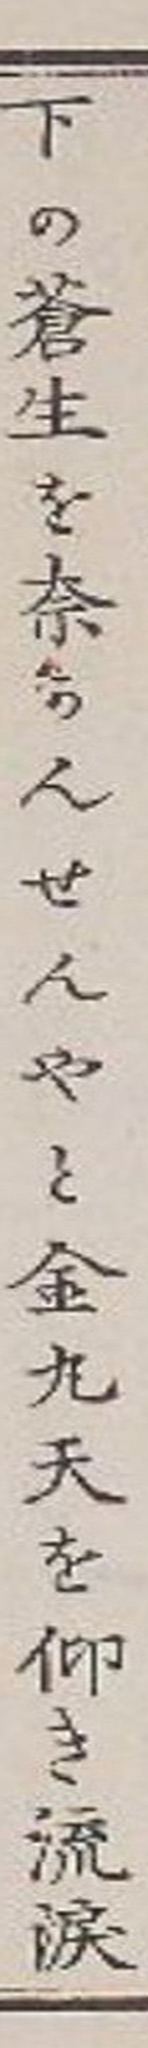下の蒼生を奈かんせんやと金丸天を仰き流涙
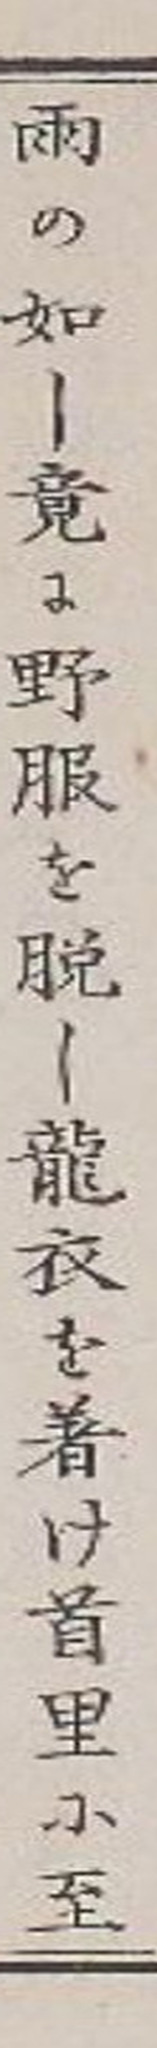雨の如し竟に野服を脱し龍衣を着け首里に至
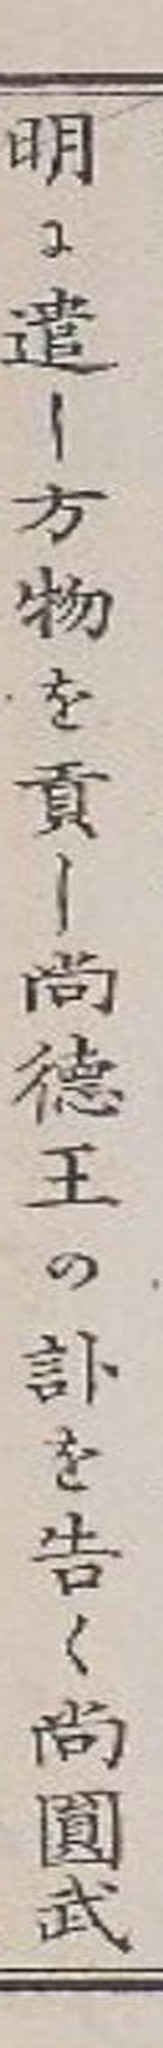明に遣し方物を貢し尚徳王の訃を告く尚円武
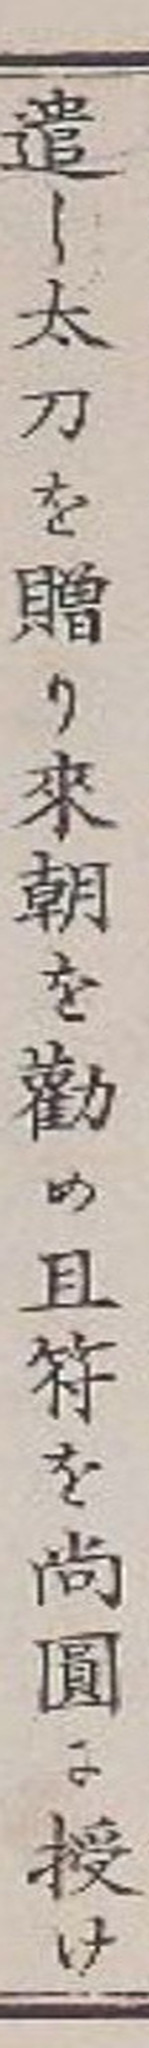遣し太刀を贈り来朝を勧め且符を尚円に授け
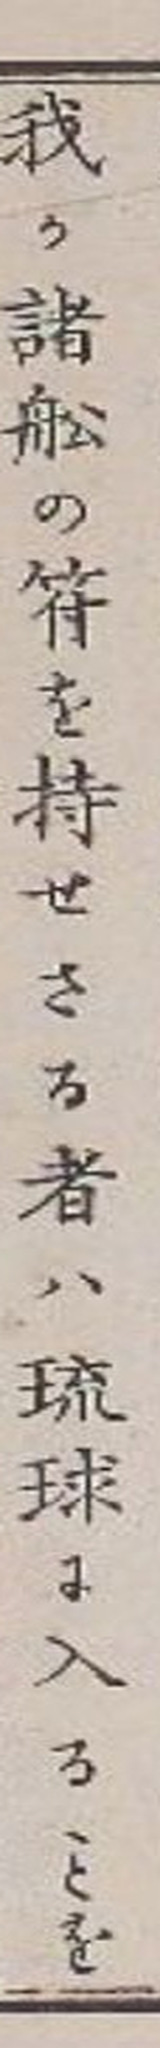我々諸船の符を持せさる者は琉球に入ることを

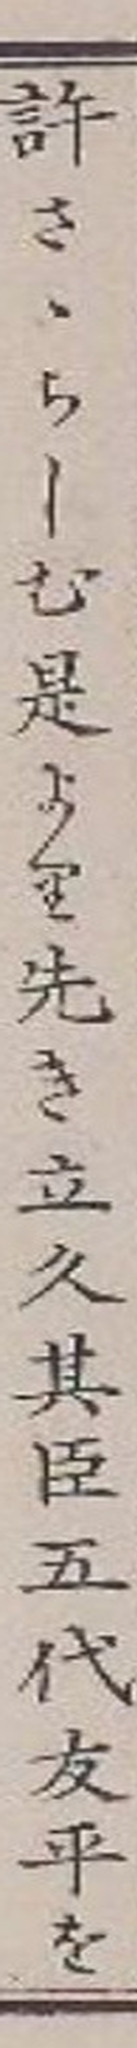許さゝらしむ是より先き立久其臣五代友平を
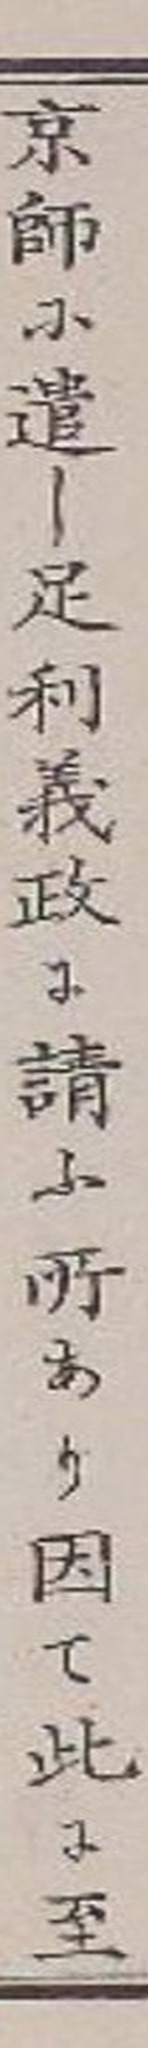京師に遣し足利義政に請ふ所あり因て此に至
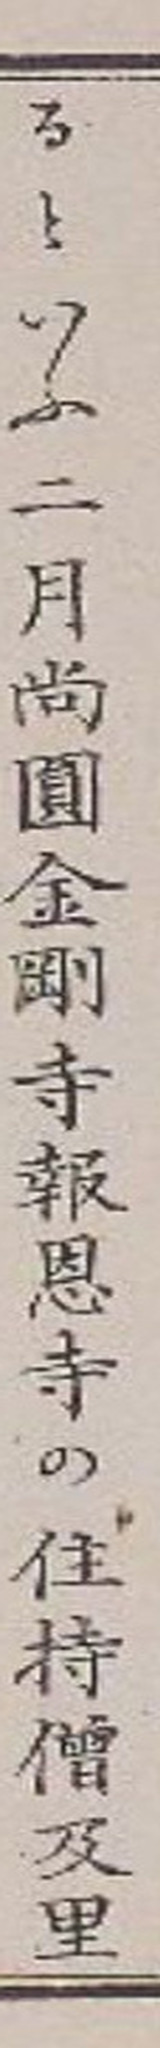るといふ二月尚円金剛寺報恩寺の住持僧及里
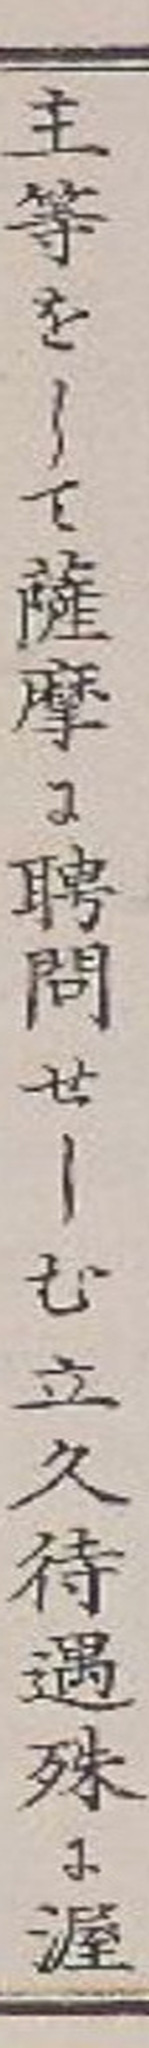主等をして薩摩に聘問せしむ立久待遇殊に渥
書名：南島紀事 中
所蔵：University of the Ryukyus Library
